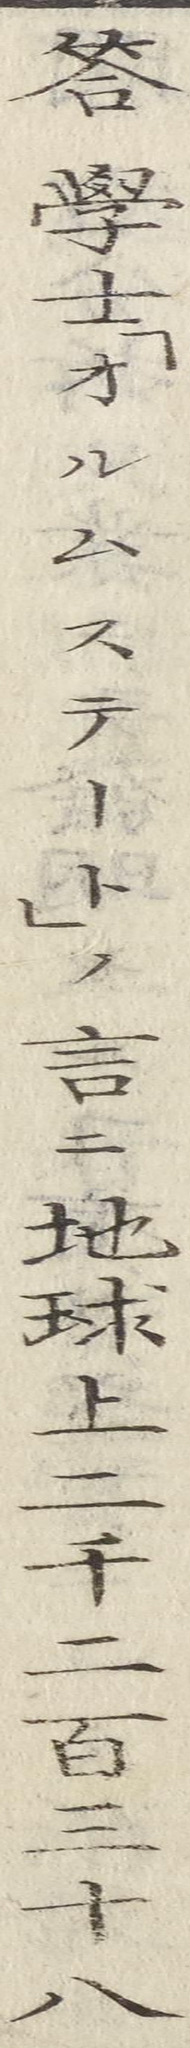答学士「オルムステート」ノ言ニ地球上二千二百三十八
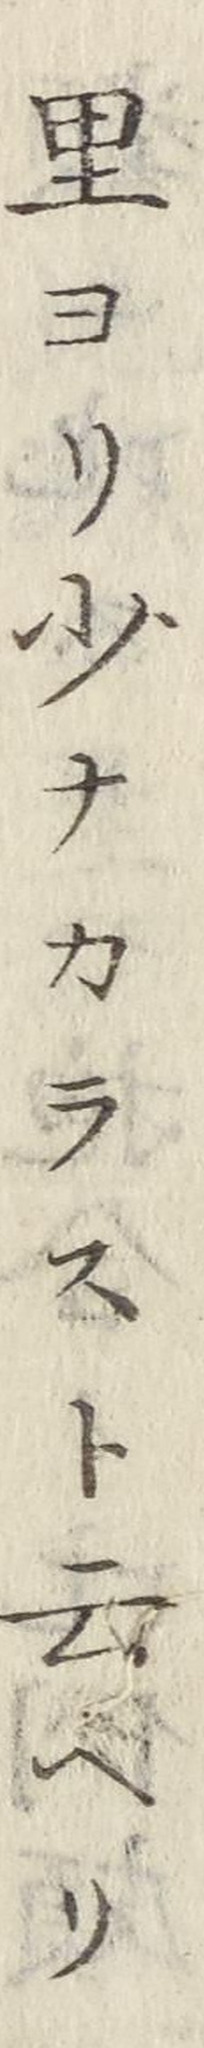里ヨリ少ナカラスト云ヘリ
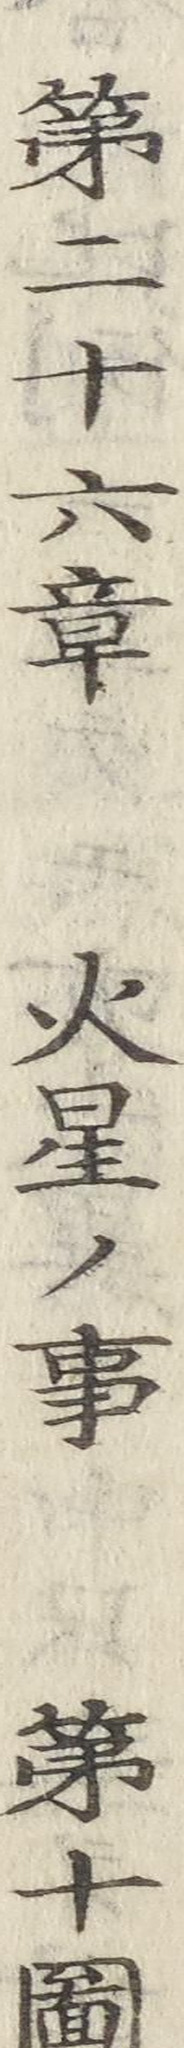第二十六章火星ノ事第十図
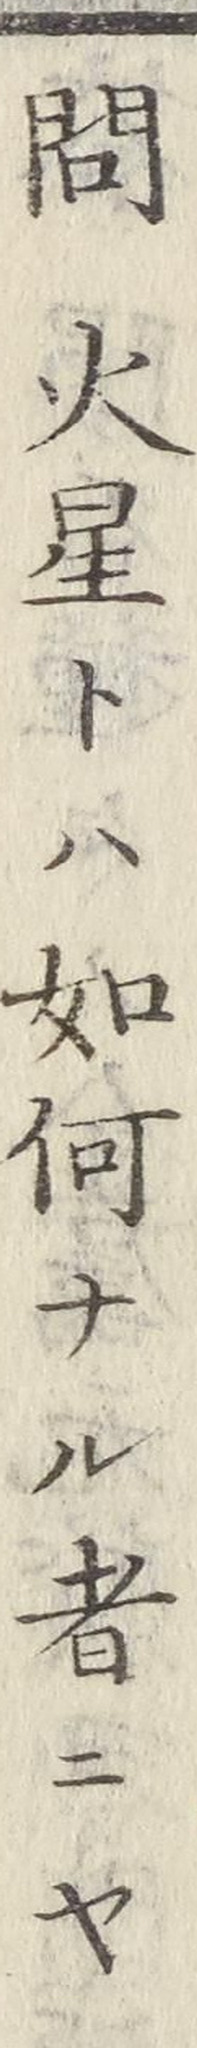問火星トハ如何ナル者ニヤ
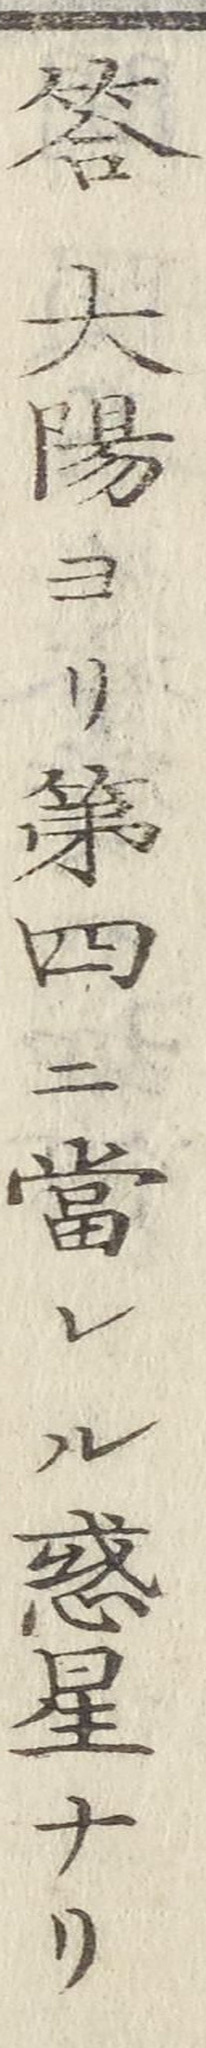答大陽ヨリ第四ニ当レル惑星ナリ
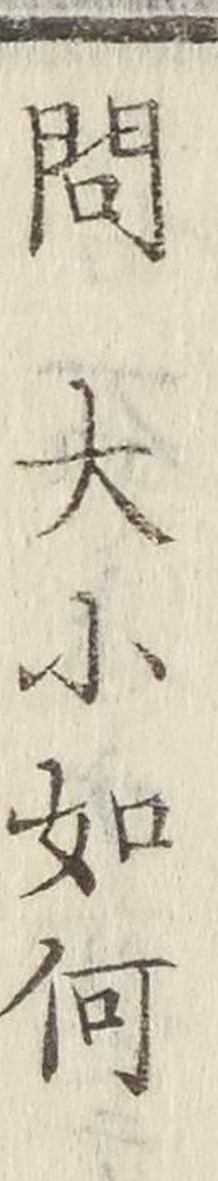問大小如何
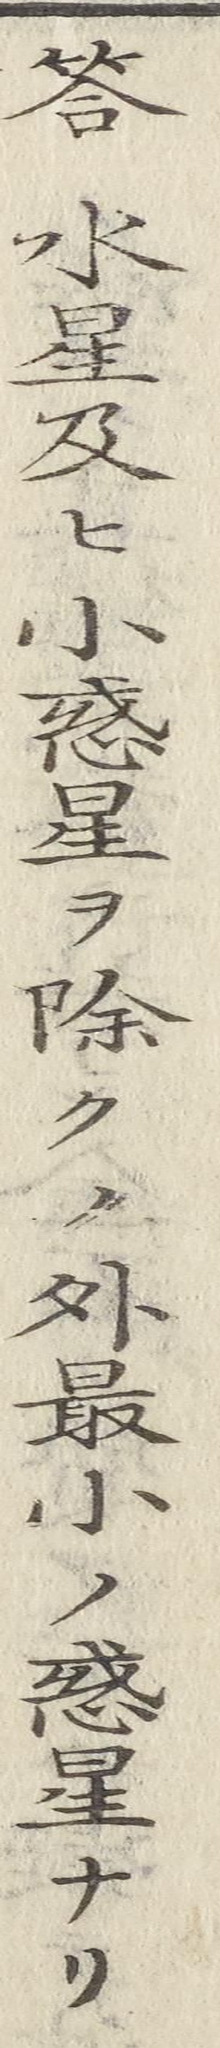答水星及ヒ小惑星ヲ除クノ外最小ノ惑星ナリ
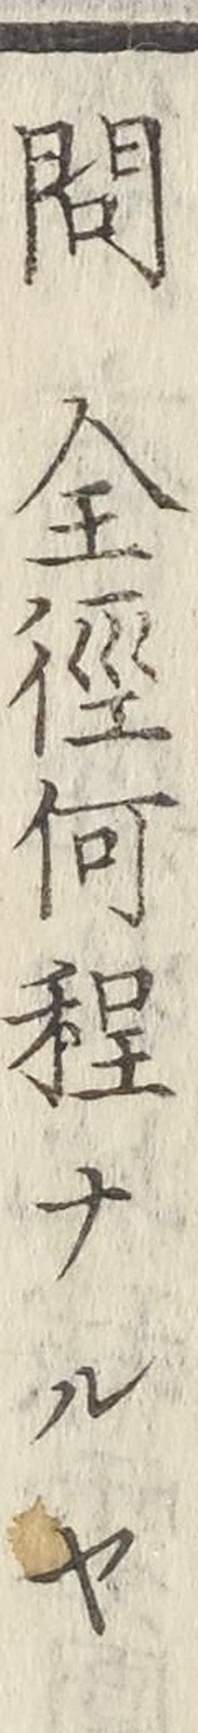問全径何程ナルヤ
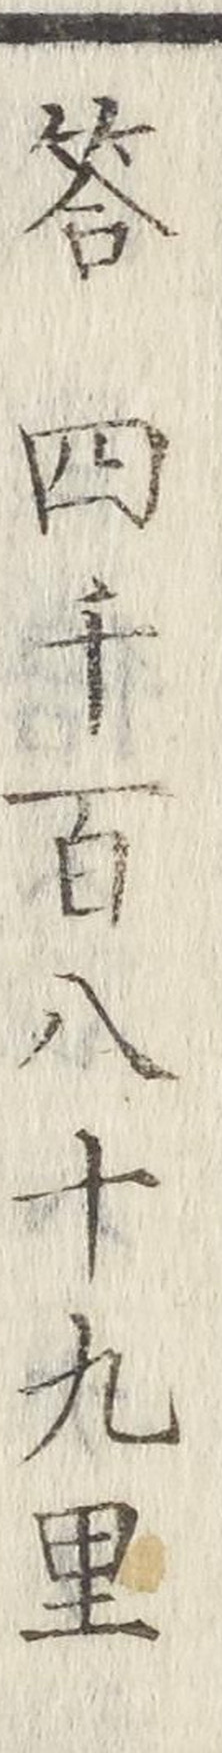答四千百八十九里
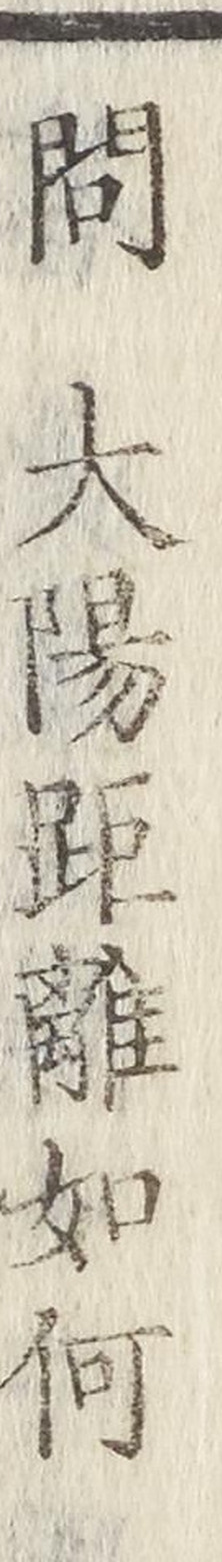問大陽距離如何
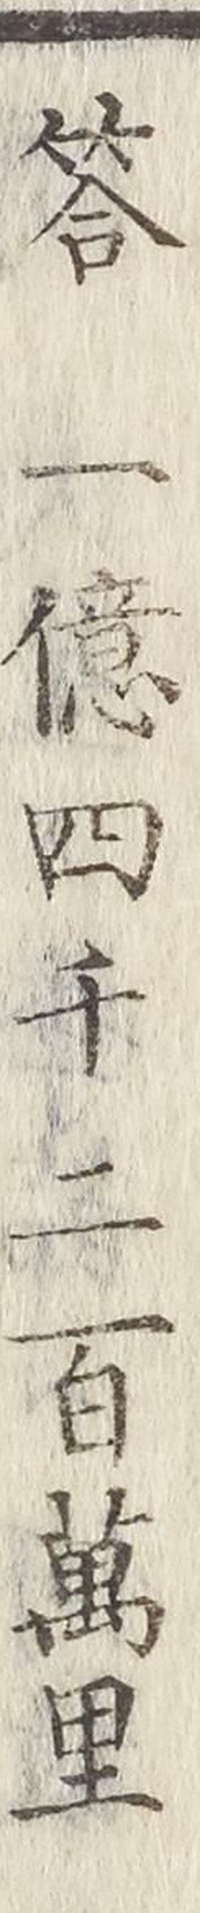答一億四千二百万里
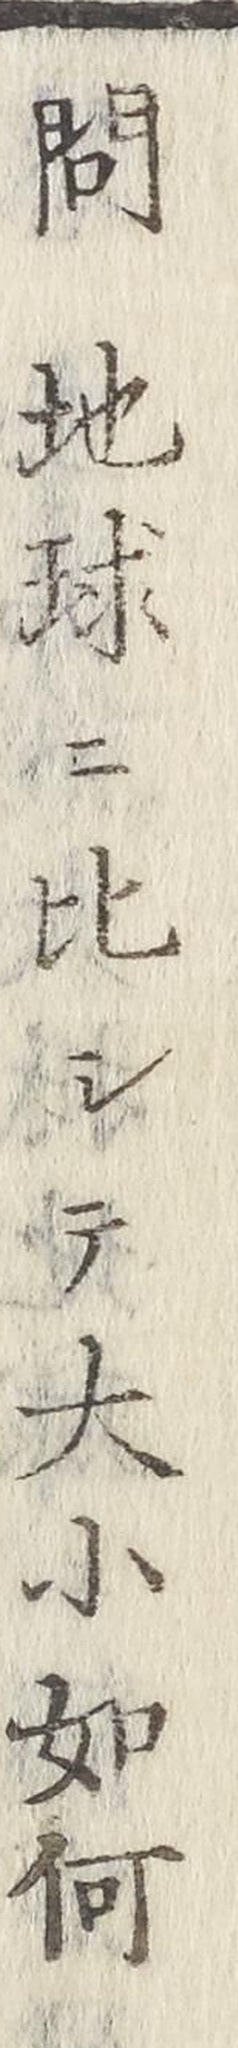問地球ニ比シテ大小如何
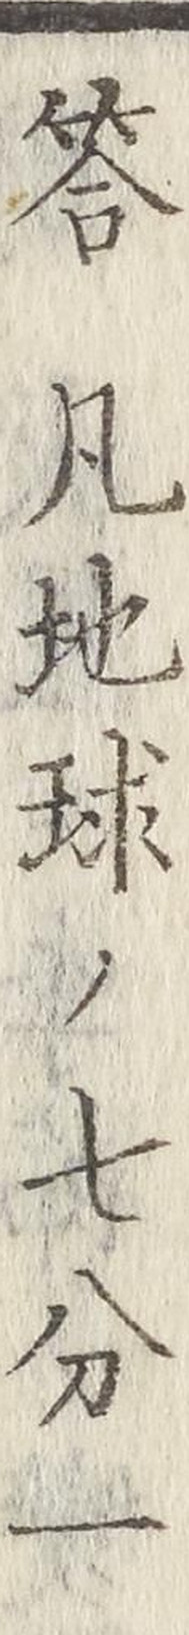答凡地球ノ七分一
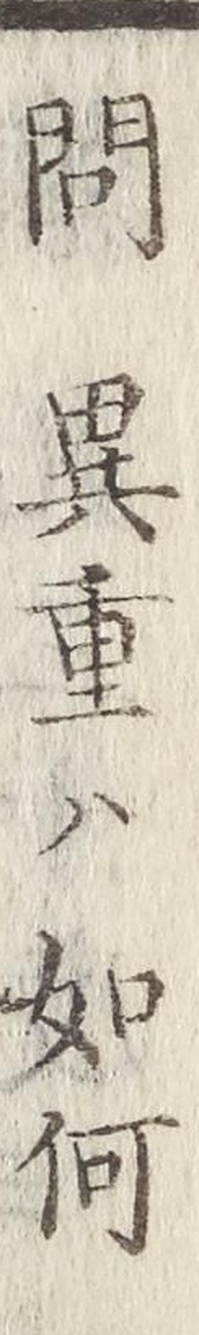問異重ハ如何
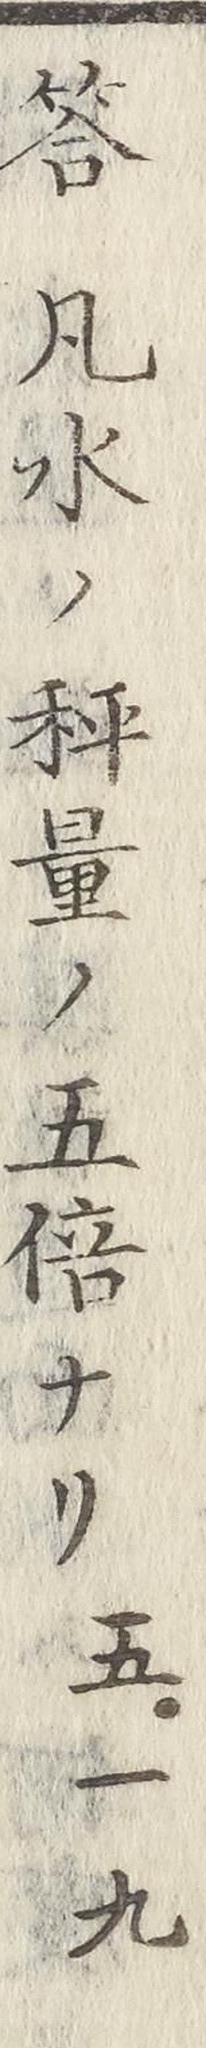答凡水ノ秤量ノ五倍ナリ五・一九
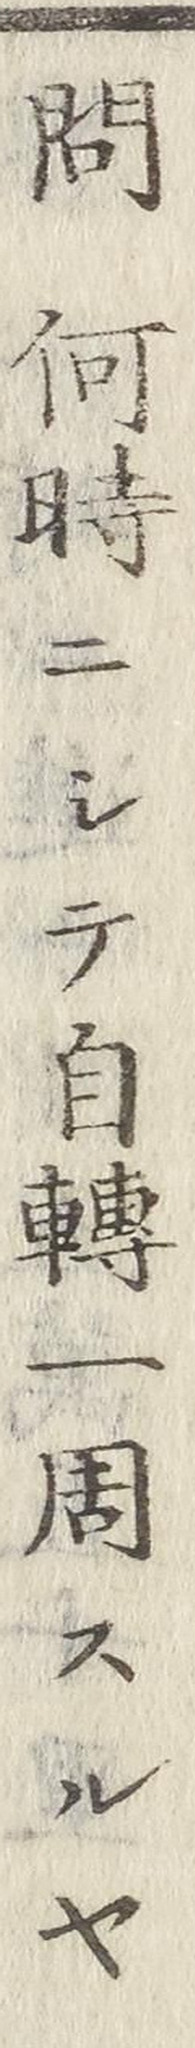問何時ニシテ自転一周スルヤ
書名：星学圖説　上
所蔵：東京大学地震研究所図書室 Earthquake Research Institute Library, The University of Tokyo, JAPAN
